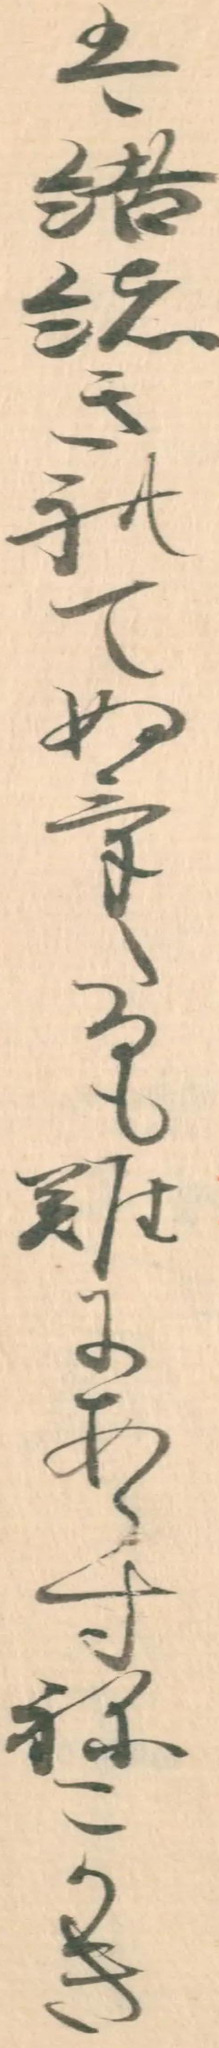は結緒きれてぬけたるも難にあらすねこかき
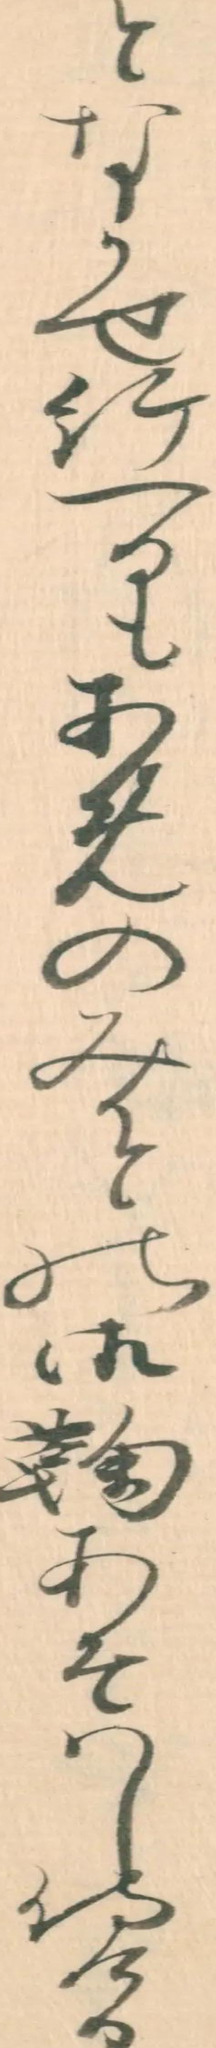となかせ給へるもあめのみその御鞠あそはし侍ける
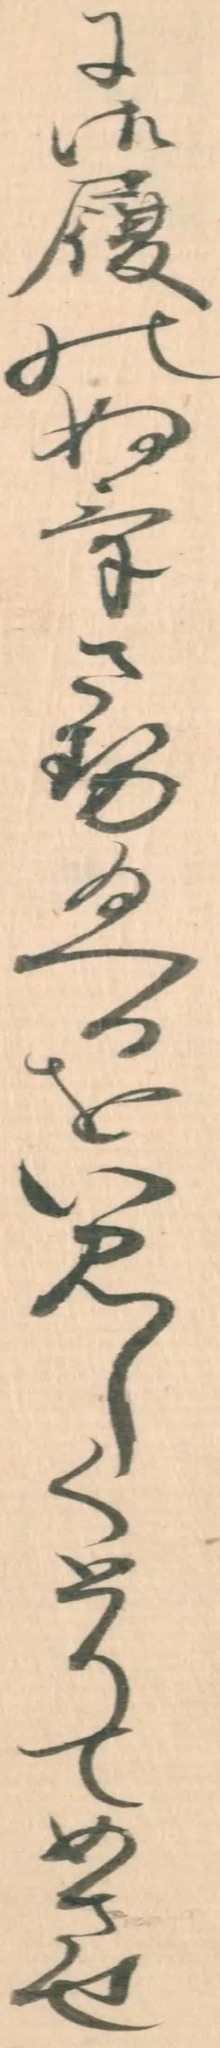に御履のぬけさせ給へるをいみしくとりてめさせ
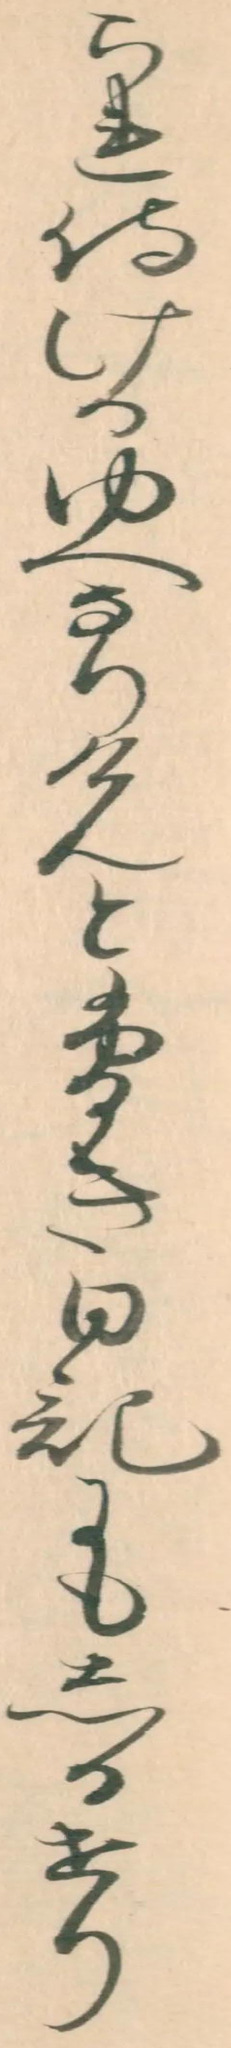られ侍けるゆへなりけんとふるき日記にもしるせり
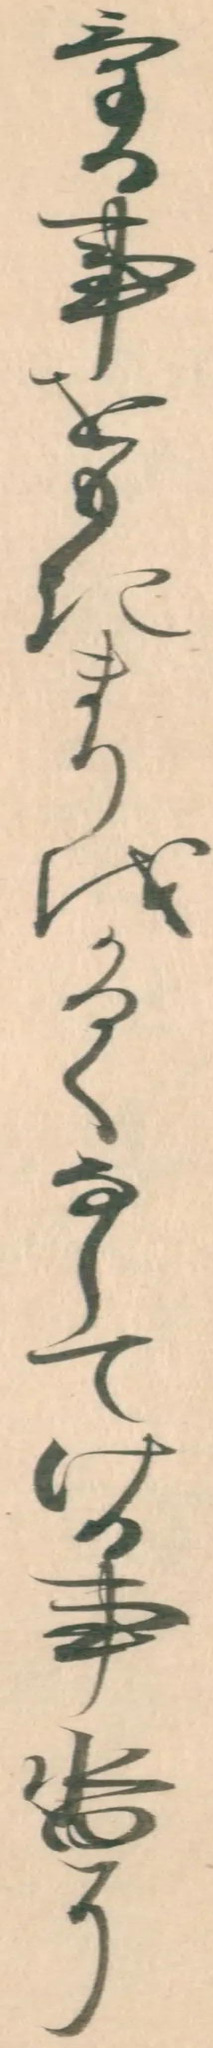ける事をもきまりをかるくなしてける事沓に

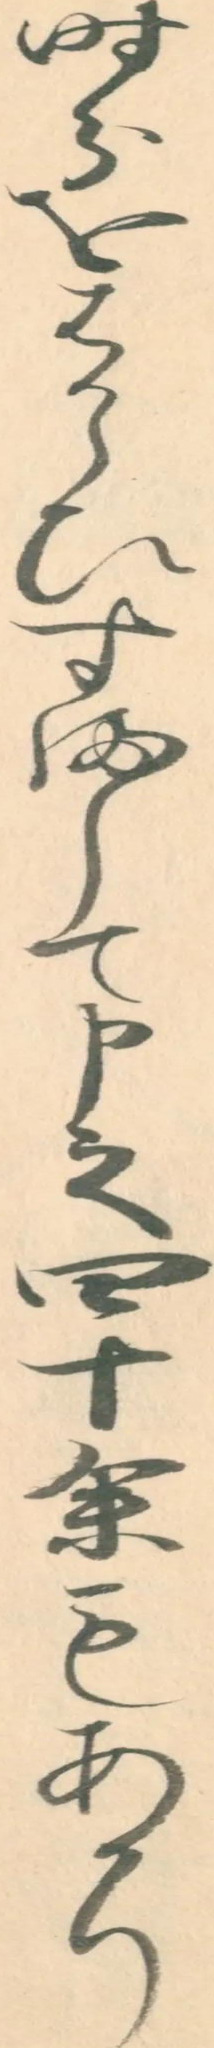時分をはからひすまして申之四十余もあかり
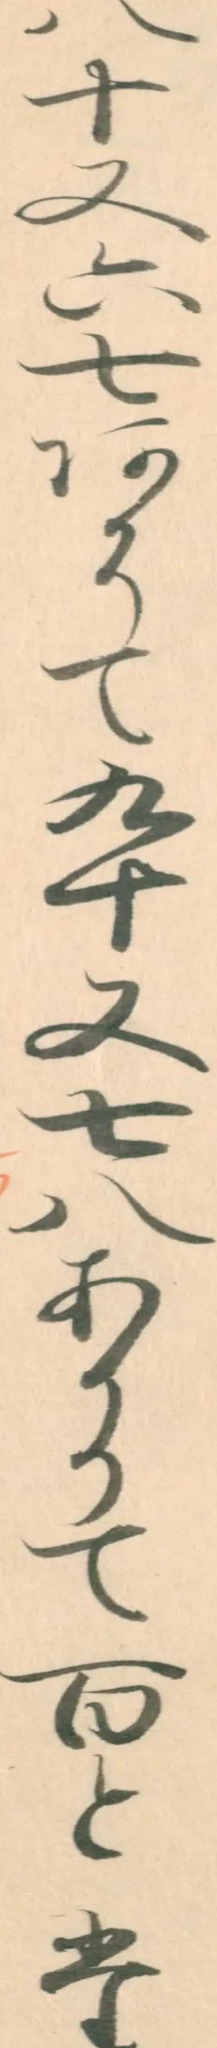八十又六七あかりて九十又七八あかりて百とた
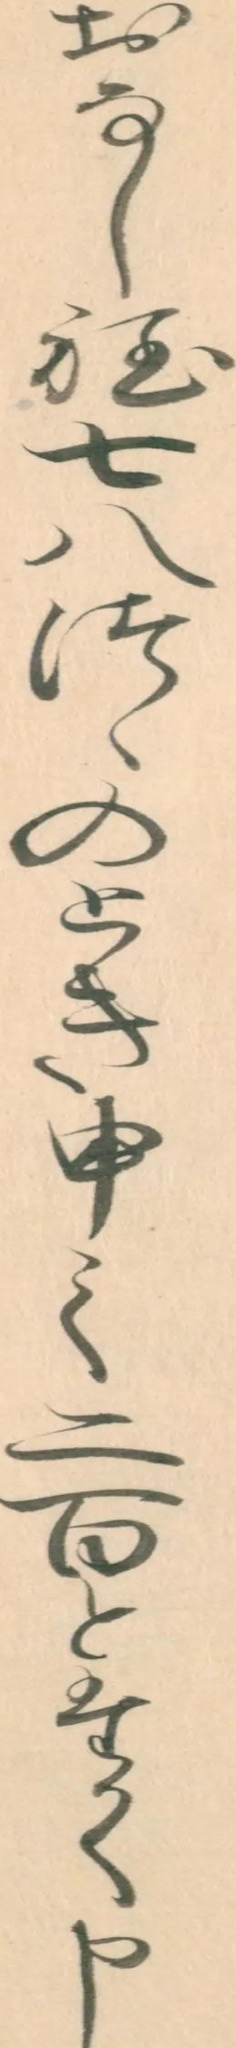おなし程七八つゝのとき申之二百とたかく申
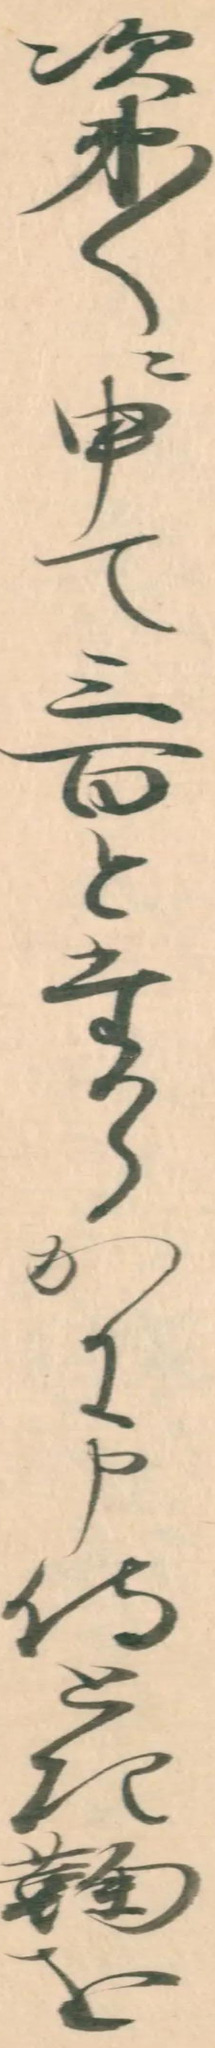次第〳〵に申て三百とたからかに申侍とき鞠を
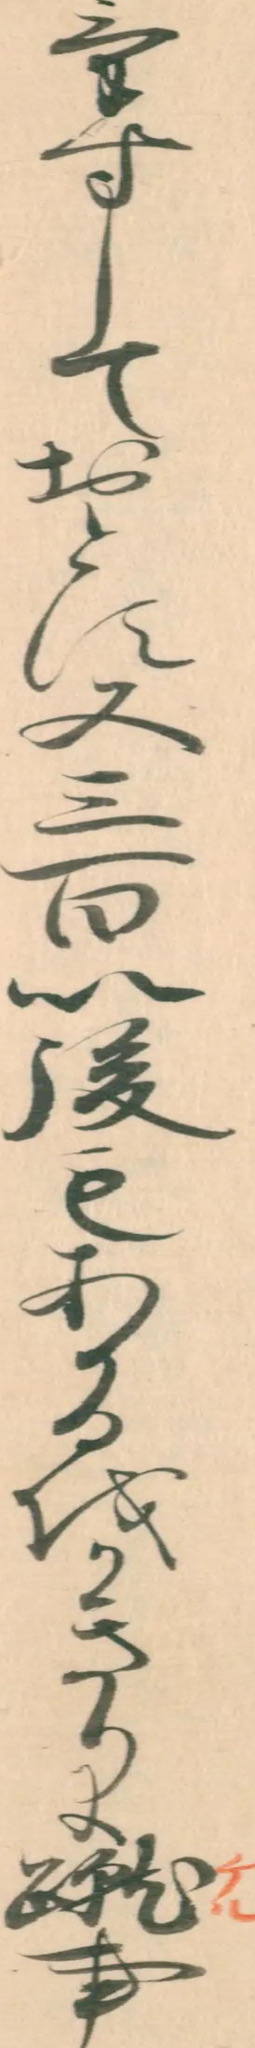けすしておとす又三百以後もあかるをかきりに蹴事
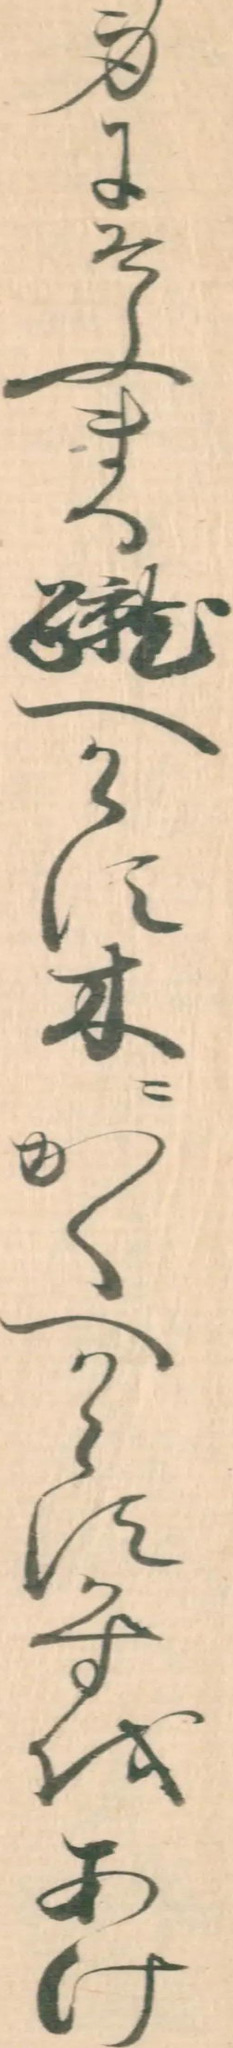身にそふまる蹴へからす木にかくへからすかすをあけ
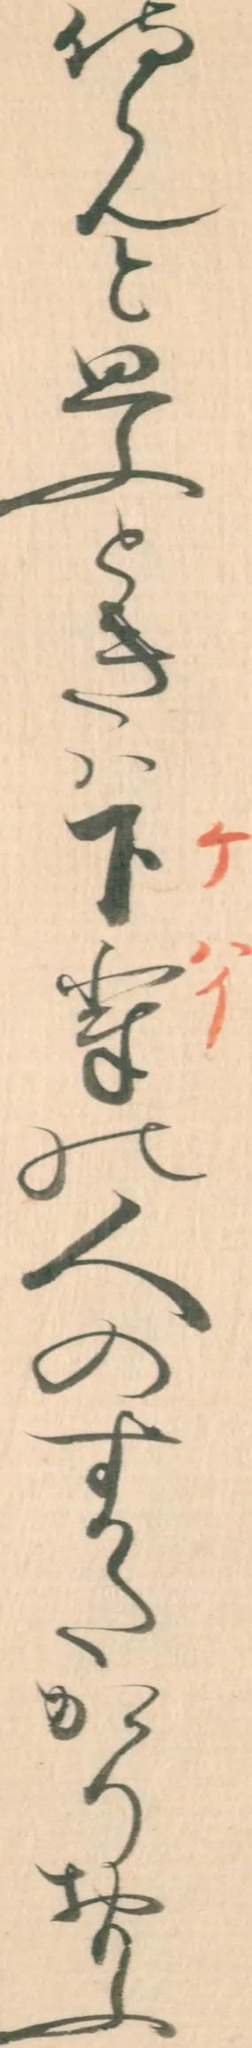侍らんと思ふときは下輩の人のすかたかりおもふ
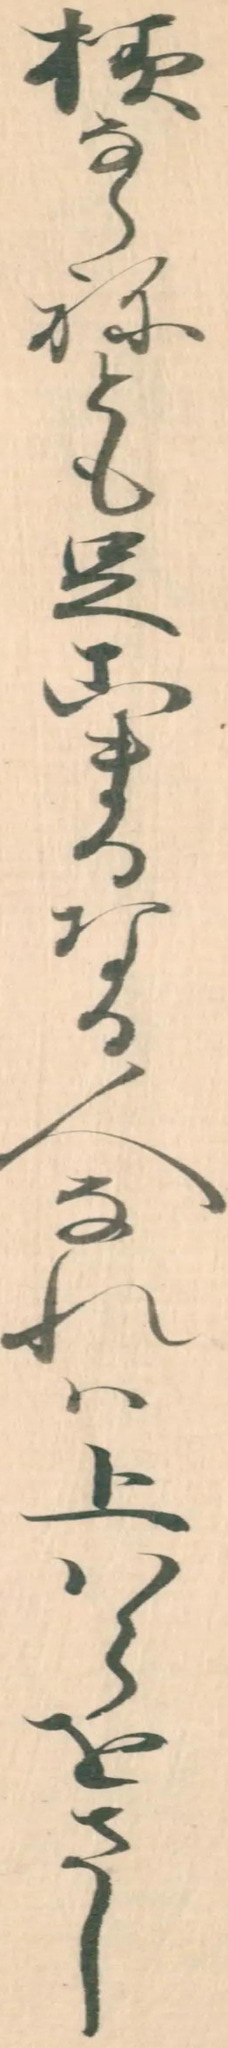様ならねとも是こまるなる人なれは上はらをさし
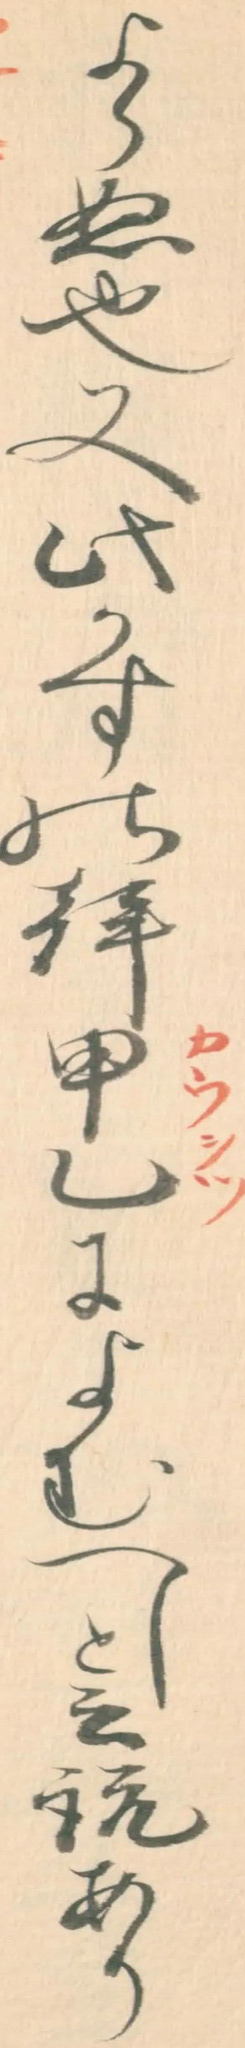よらぬ也又此かすの料甲乙によむへしと云説あり

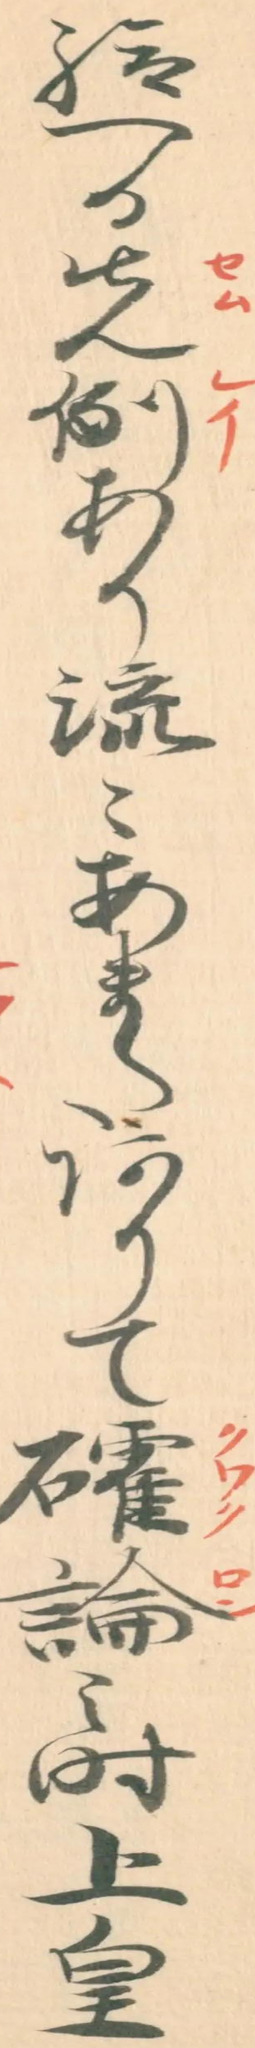給へる先例あり流々あまたありて礭論之時上皇
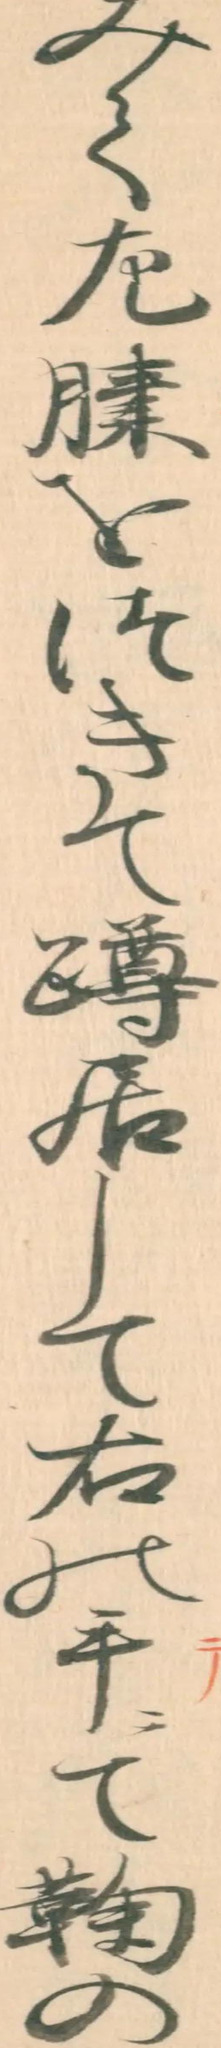みて左膝をつてきて蹲居して右の手にて鞠の
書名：遊庭秘抄 2巻. [1]
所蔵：国立国会図書館 National Diet Library, JAPAN
